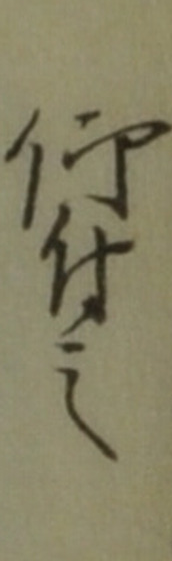仰付之
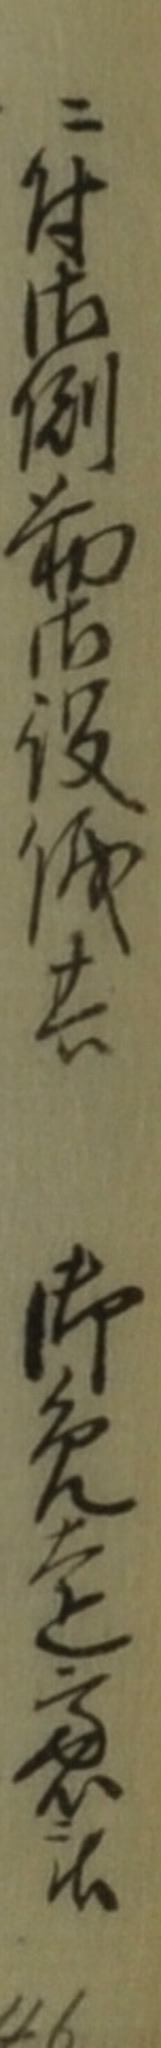ニ付御側勤御役儀者御免遠慮被
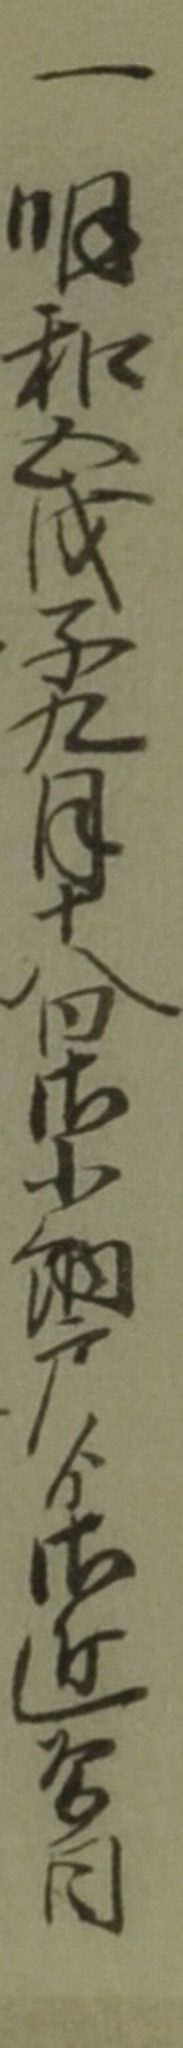一明和五戊子九月十八日御小納戸ゟ御近習目
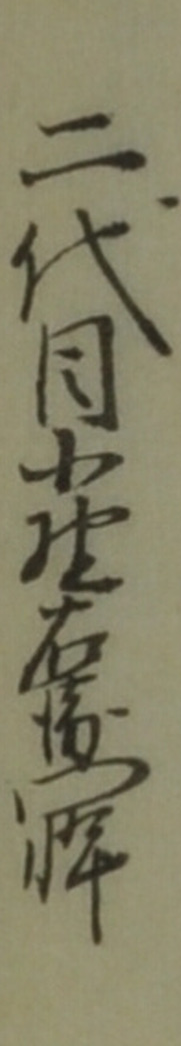二代目小野右衛門忰
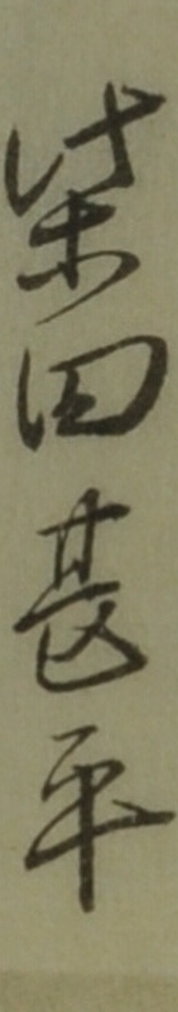柴田甚平
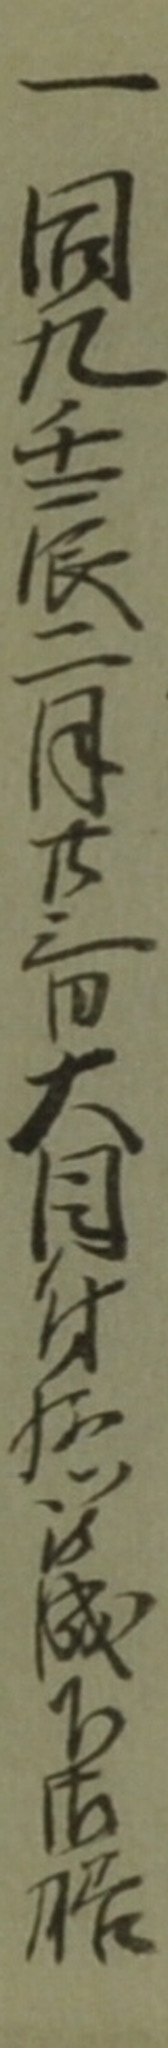一同九壬辰二月廿三日大目付格被成下御膳
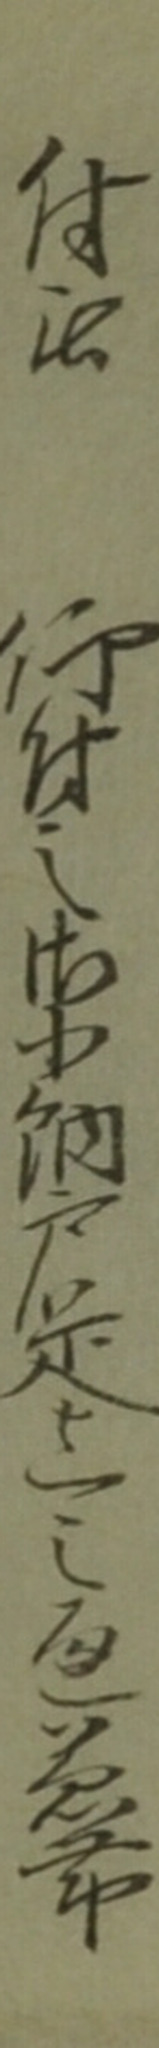付被仰付之御小納戸是迄之通兼帯
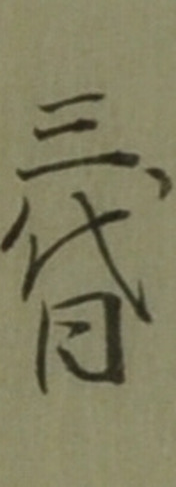三代目
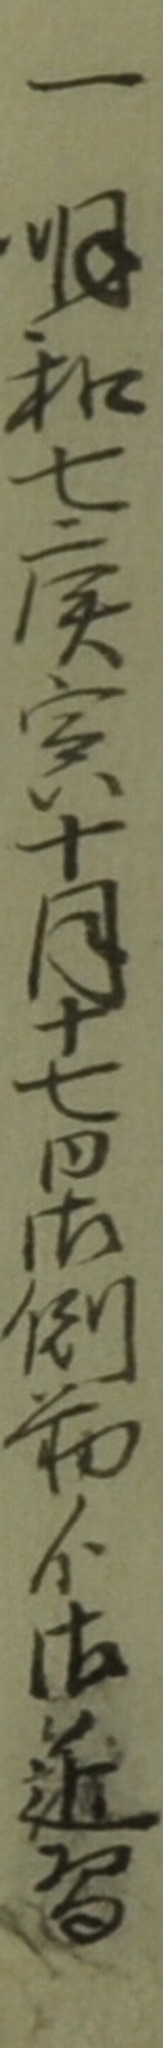一明和七庚寅十月十七日御側勤ゟ御近習
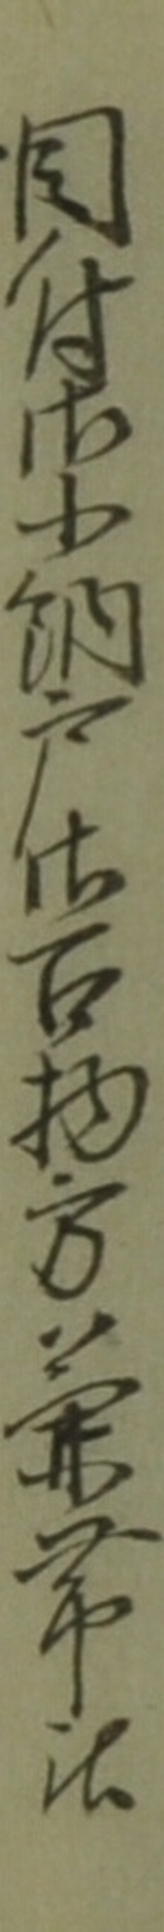目付御小納戸御召物方兼帯被
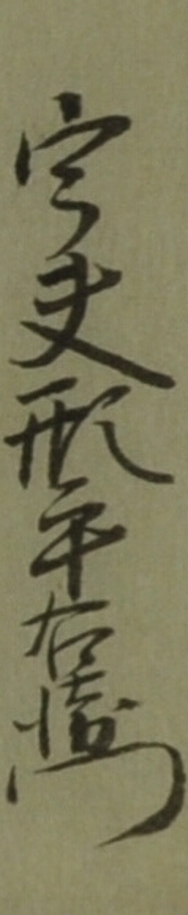宇夫形平右衛門
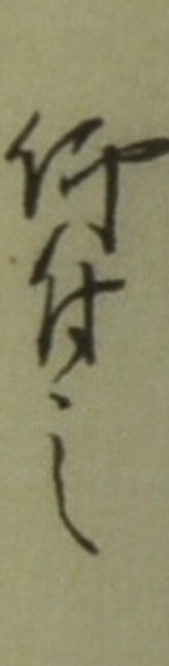仰付之

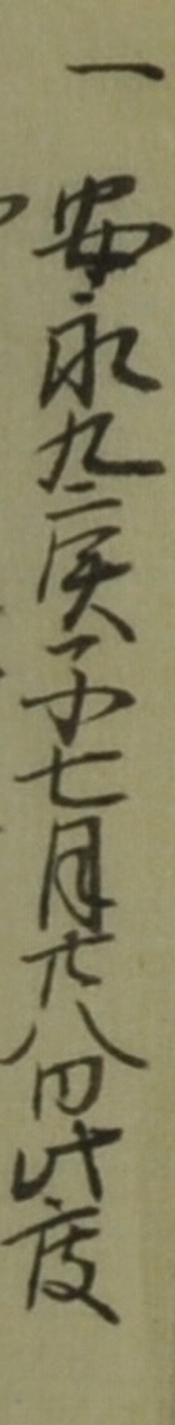一安永九庚子七月廿八日此度
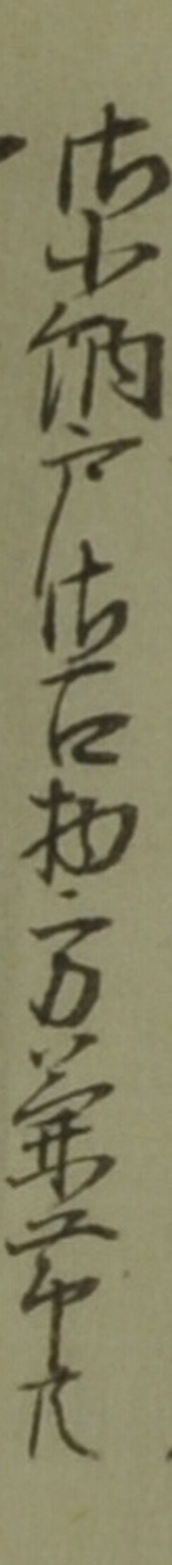御小納戸御召物方兼帯共
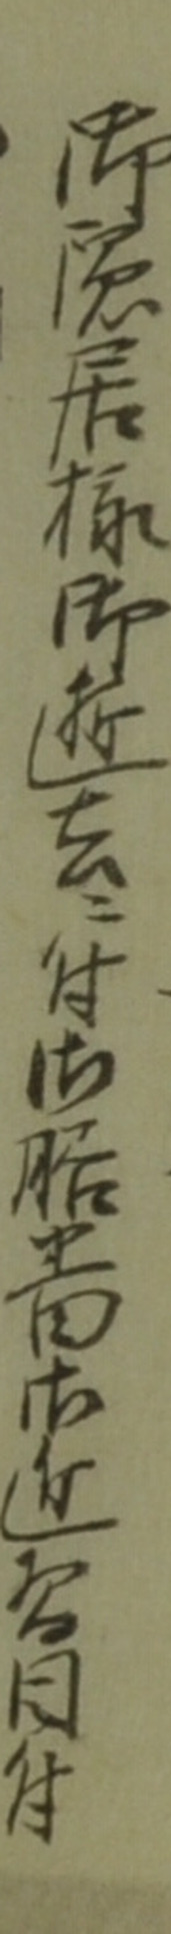御隠居様御逝去ニ付御膳番御近習目付
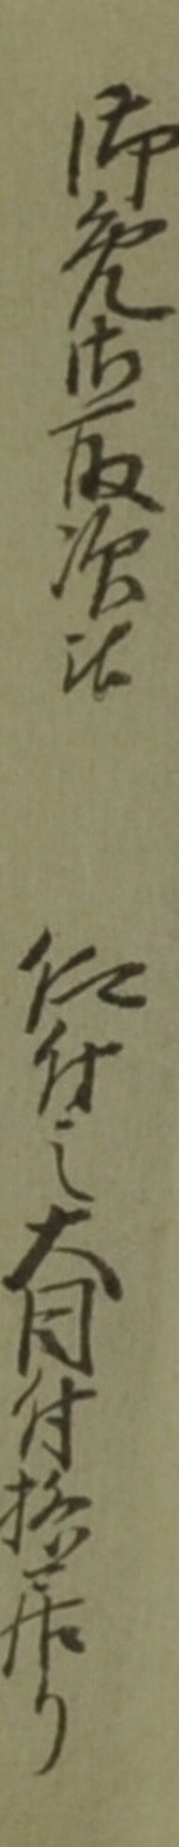御免御取次被仰付之大目付格居リ
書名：諸御役代々録（四）
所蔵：伊那市立高遠町図書館・合同会社AMANE
